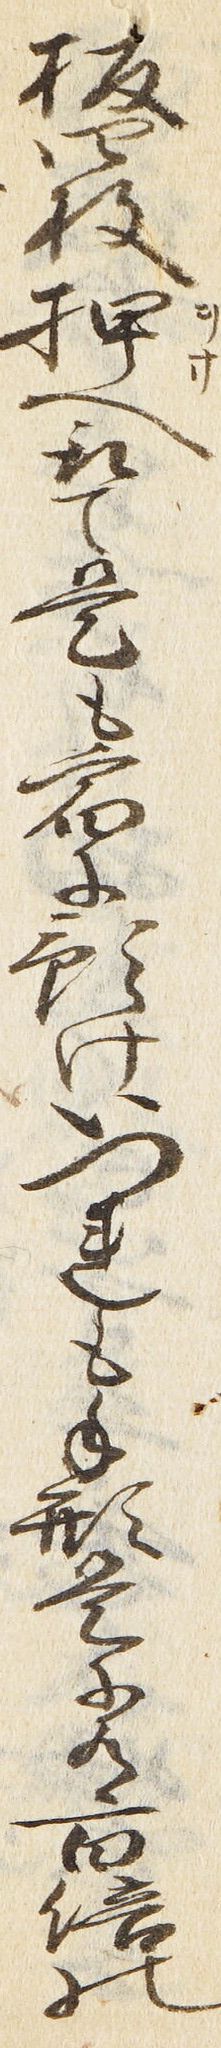板四枚押へ取て是も宿に預けいつれも手形是に有百倍の
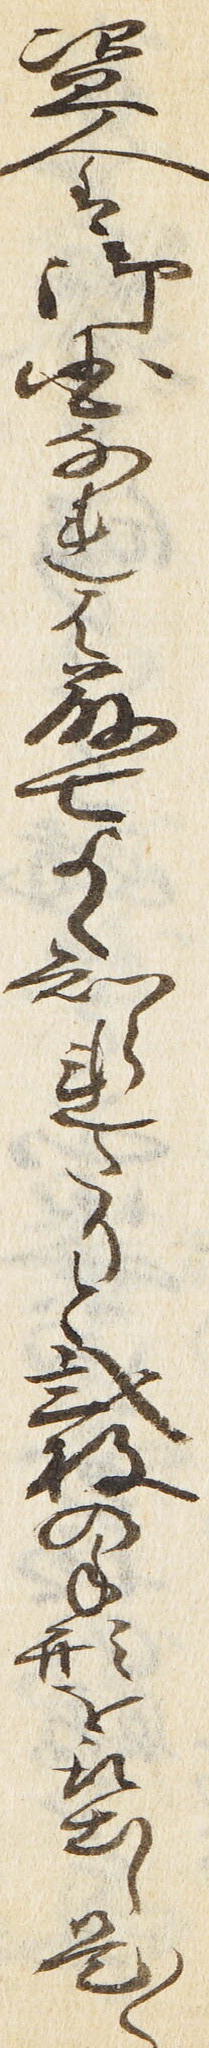盗人は御国なれは藤七よく知られたりと弐枚の手形を取出し是〳〵
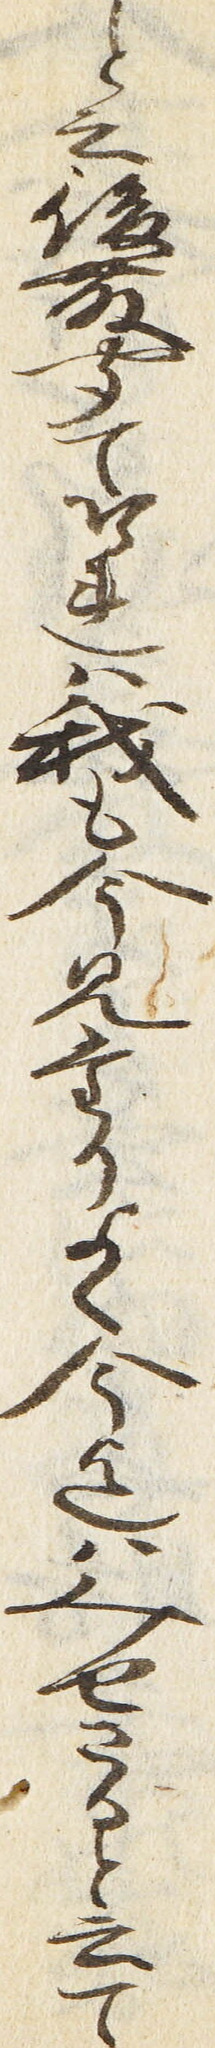と云後藤聞てそれは我も今見たりよく今迄はみせさると云て
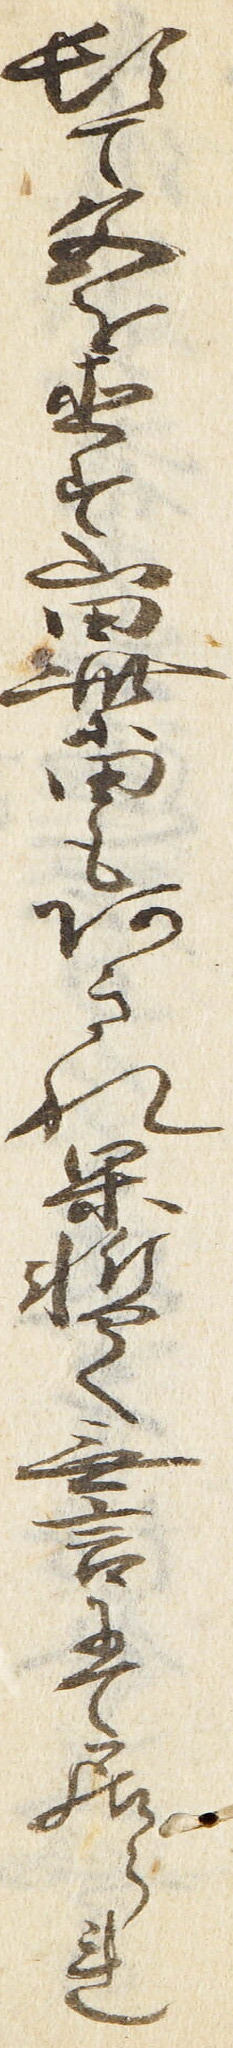頓て色を直す山田柴田もあきれ果暫く無言にて居られ
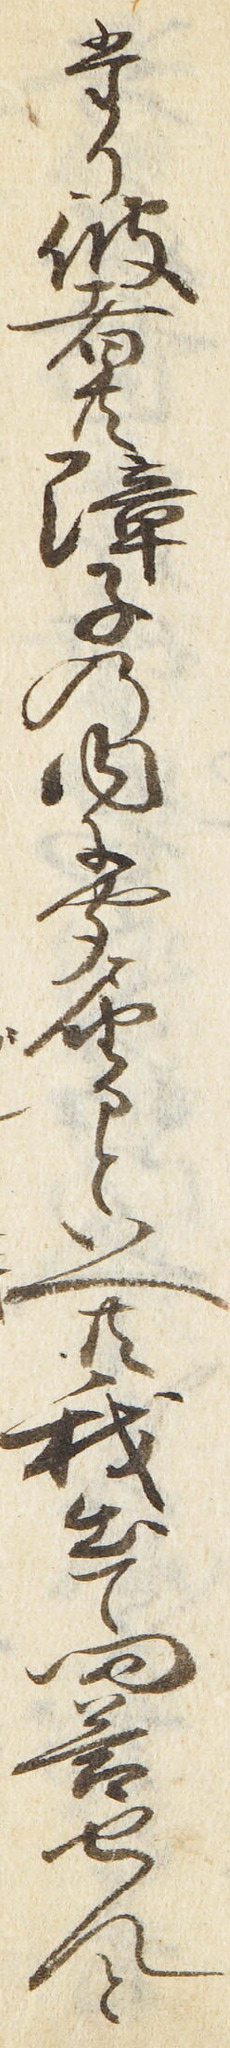たり彼者共障子の内に聞届るといへ共我出て問答せんと
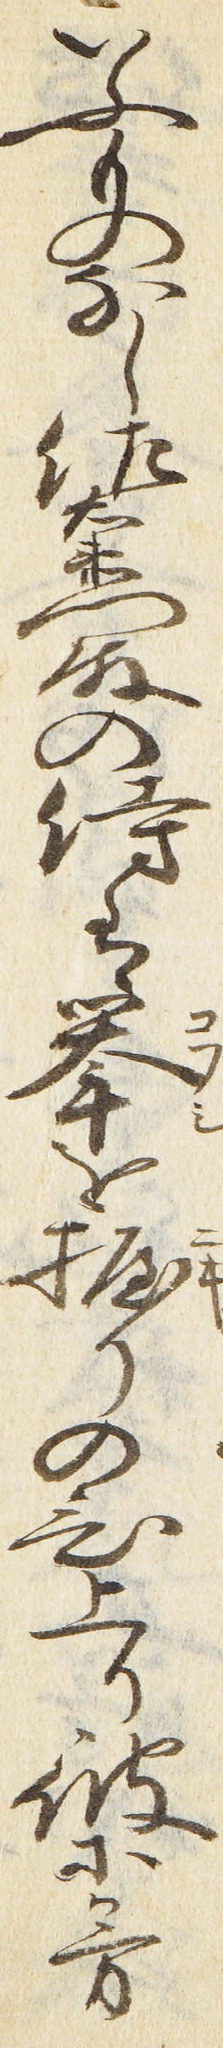いふものなし佐右衛門殿の侍は拳を握りのひ上り彼等か方
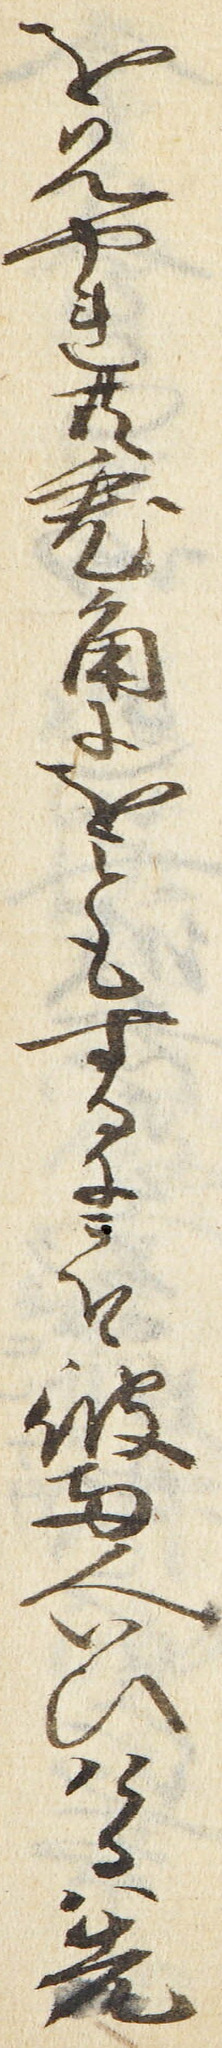を見やれ共兎角にをともするにこそ彼両人いひけるは先

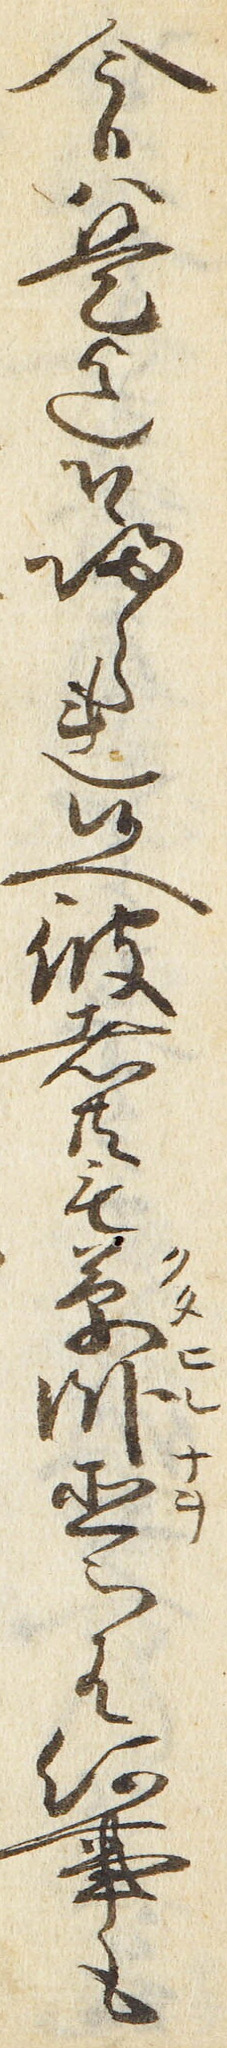今日は是迄そ帰られ候へ彼者共も草臥直らは何事も
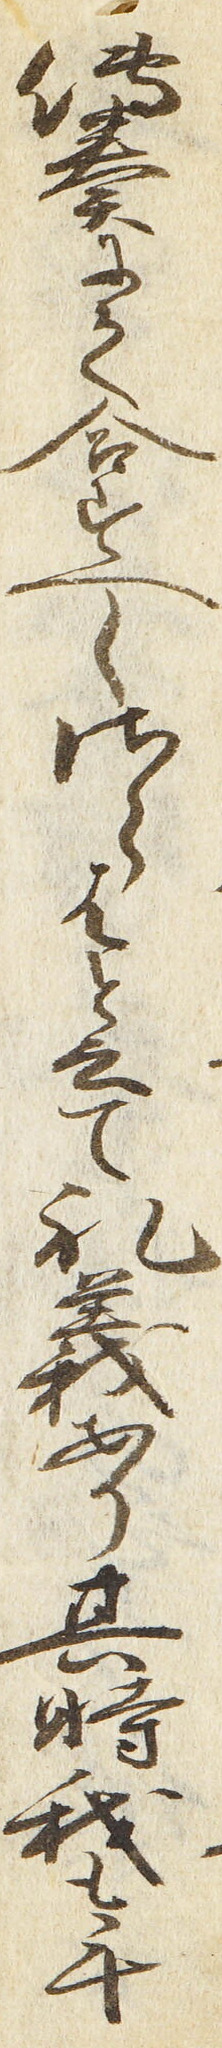伝奏にて合すへしさらはと云て礼義あり其時我も手
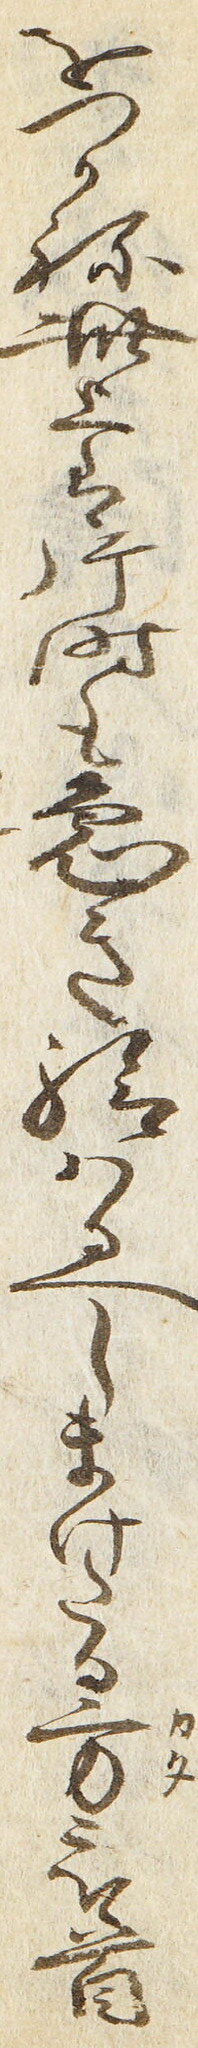をつかね此上は片時も急き給はるへしまけたる方こそ首
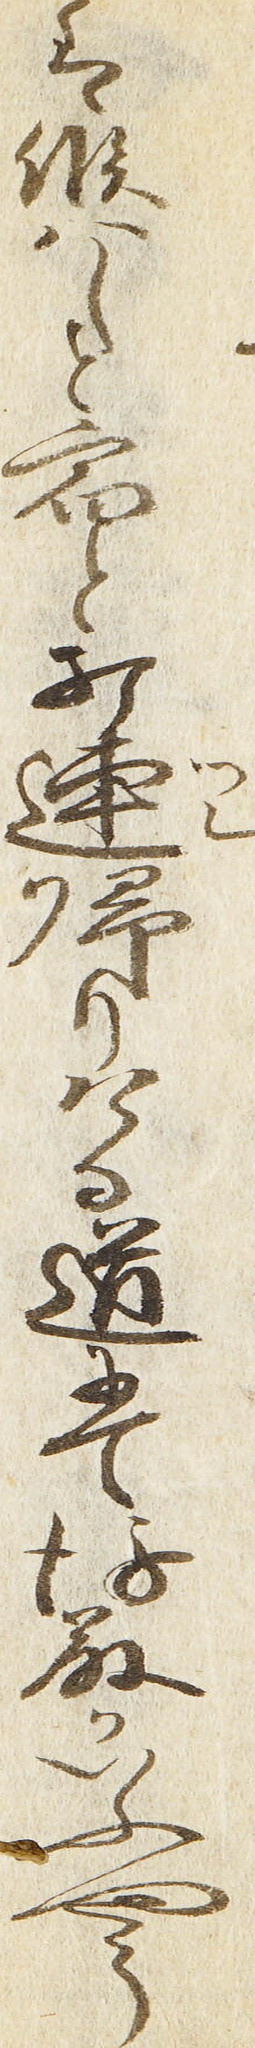は候はしと宿と打連帰りける道にて後藤かいふやう
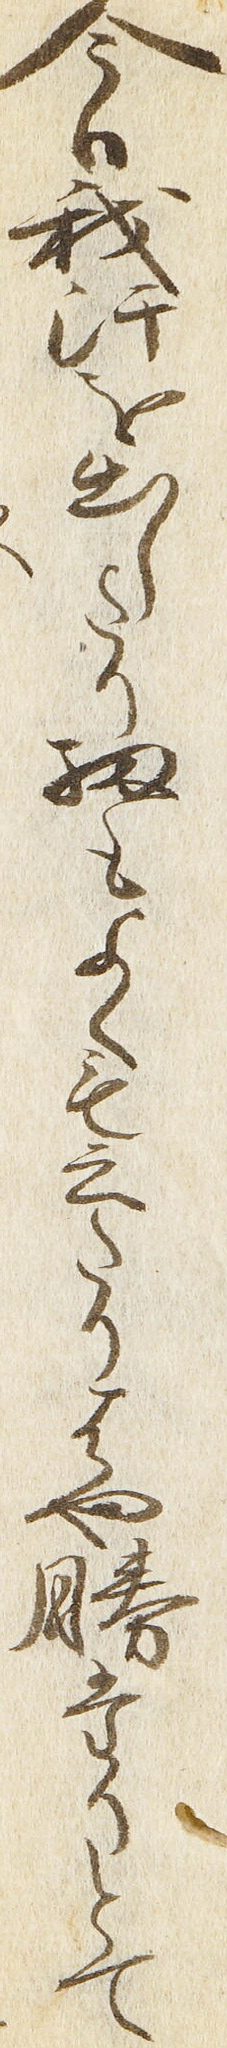今日我汗を出したり扨もよくも云たりはや勝たりとて
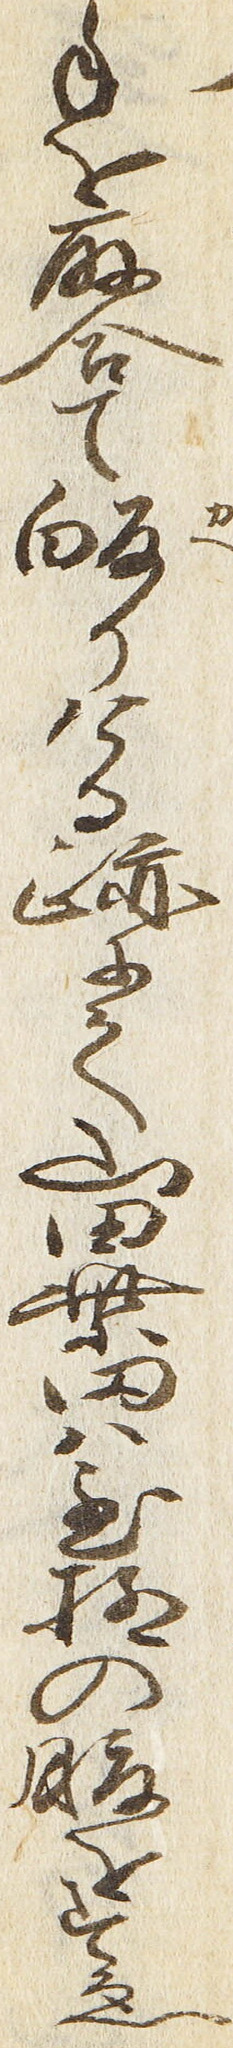手を取合て皈りける跡にて山田柴田は至極の腹をすゑ
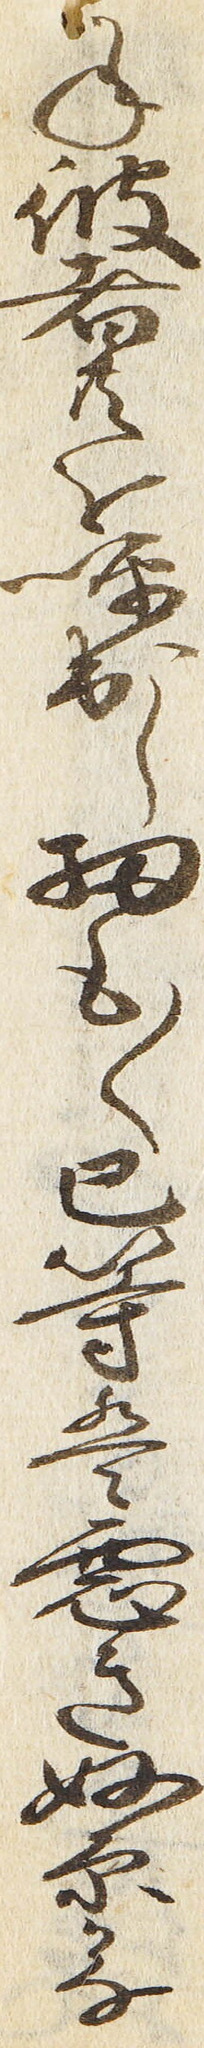かね彼者共を呼出し扨も〳〵己等は悪き奴原かな
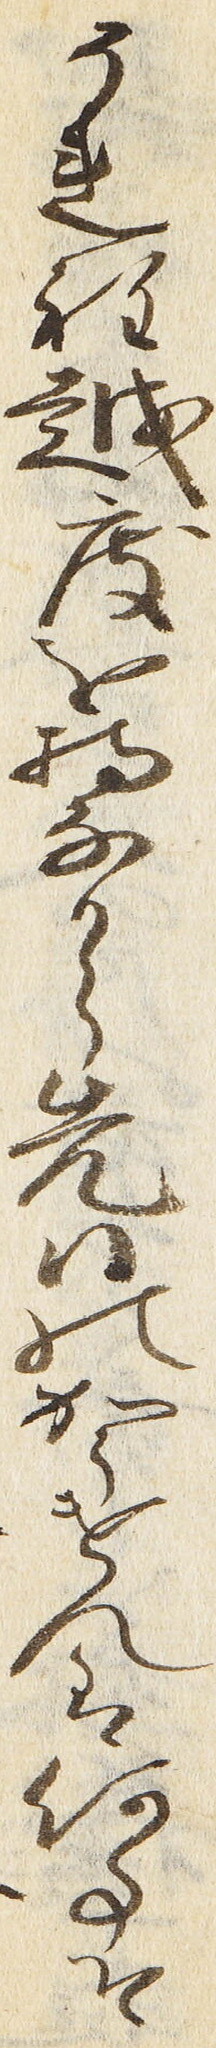それ程越度を持なから先日のかうけんは何事そ
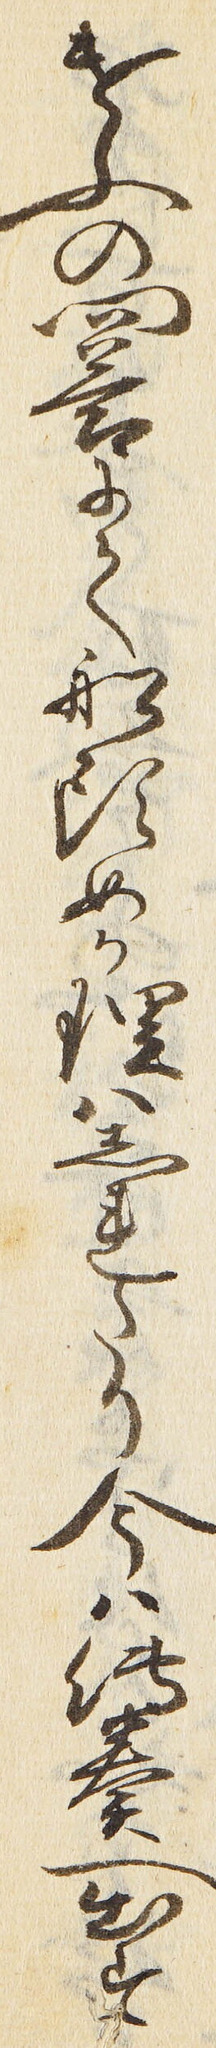けふの問答にて船頭めか理はしれたり今は伝奏へ出す
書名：海陸世話日記
